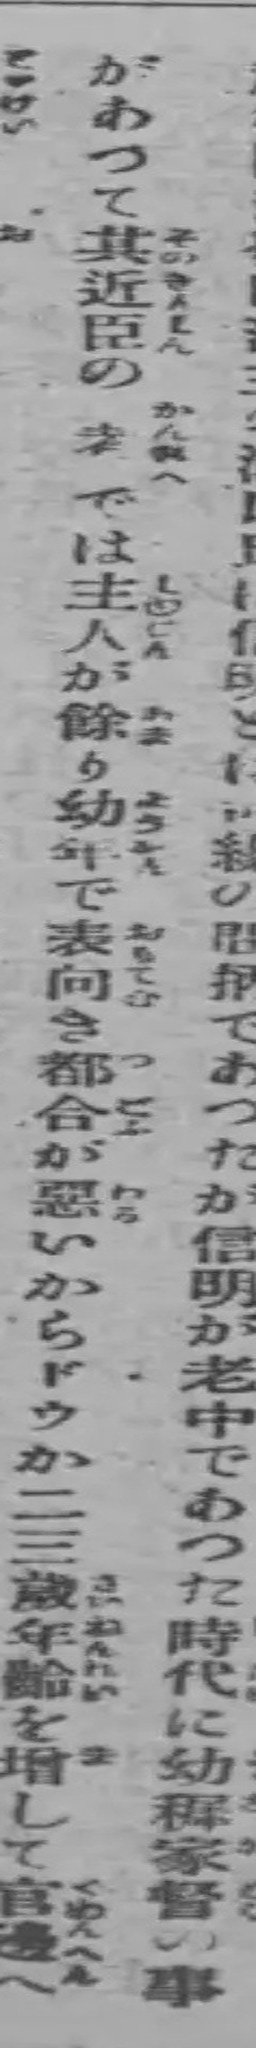があつて其近臣の考では主人が余り幼年で表向き都合が悪いからドウか二三歳年齢を増して官辺へ
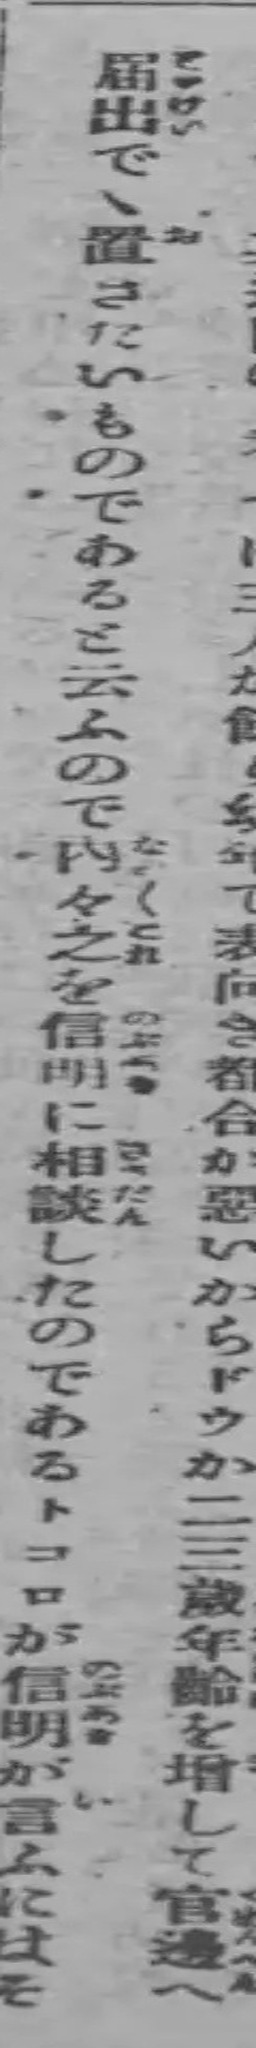届出でゝ置きたいものであると云ふので内々之を信明に相談したのであるトコロが信明が言ふにはそ
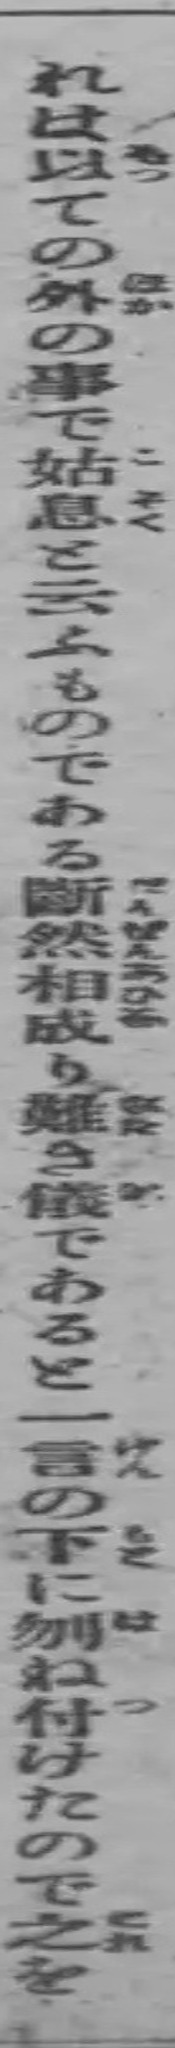れは以ての外の事で姑息と云ふものである断然相成り難き儀であると一言の下に刎ね付けたので之を
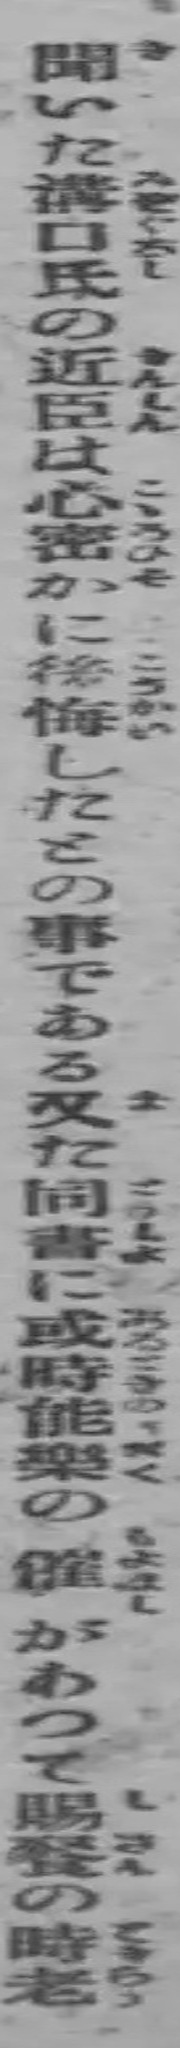聞いた溝口氏の近臣は心蜜かに後悔したとの事である又た同書に或時能楽の催があつて賜餐の時老
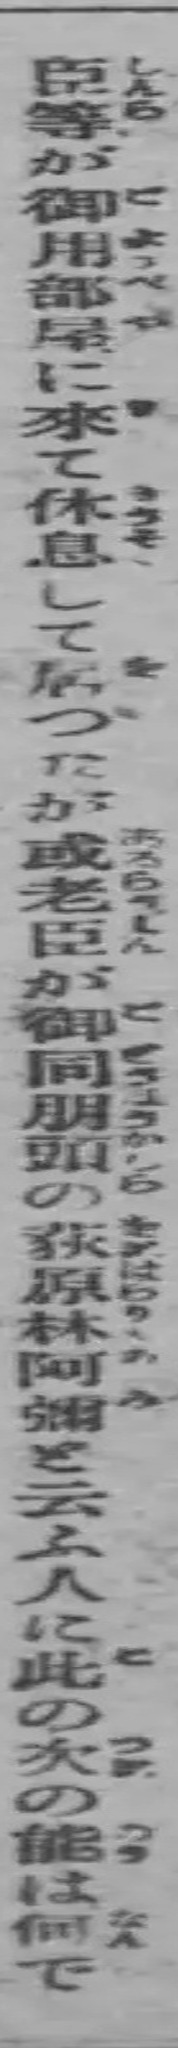臣等が御用部屋に来て休息して居つたが或老臣が御同朋頭の荻原林阿弥と云ふ人に此の次の能は何で
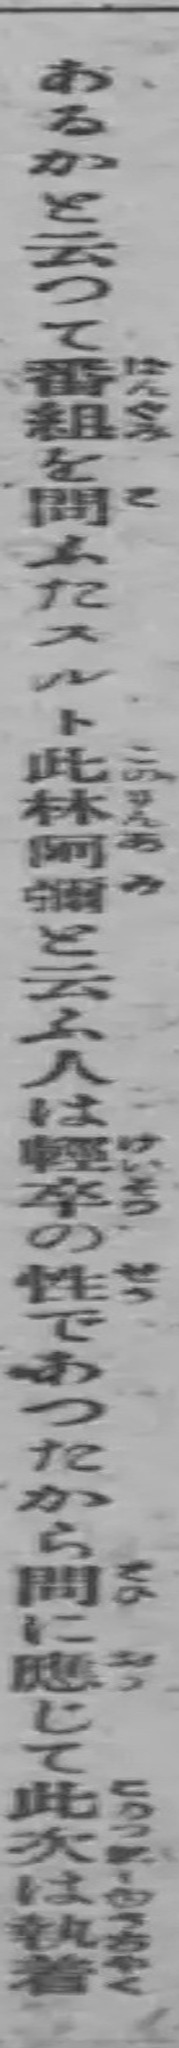あるかと云つて番組を問ふたスルト此林阿弥と云ふ人は軽率の性であつたから問に応じて此次は執着
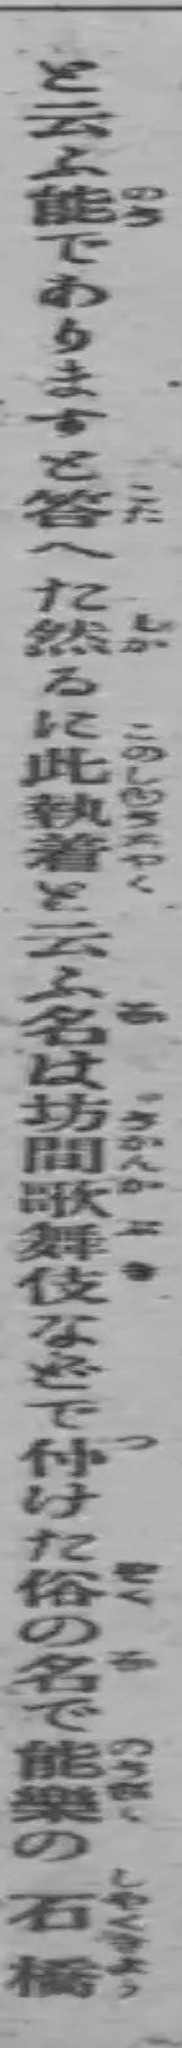と云ふ能でありますと答へた然るに此執着と云ふ名は坊間歌舞伎などで付けた俗の名で能楽の石橋
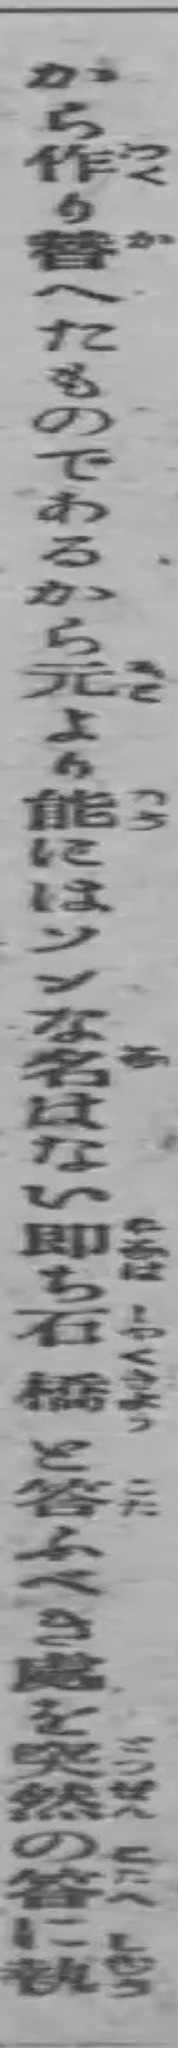から作り替へたものであるから元より能にはソンな名はない即ち石橋と答ふべき処を突然の答に執
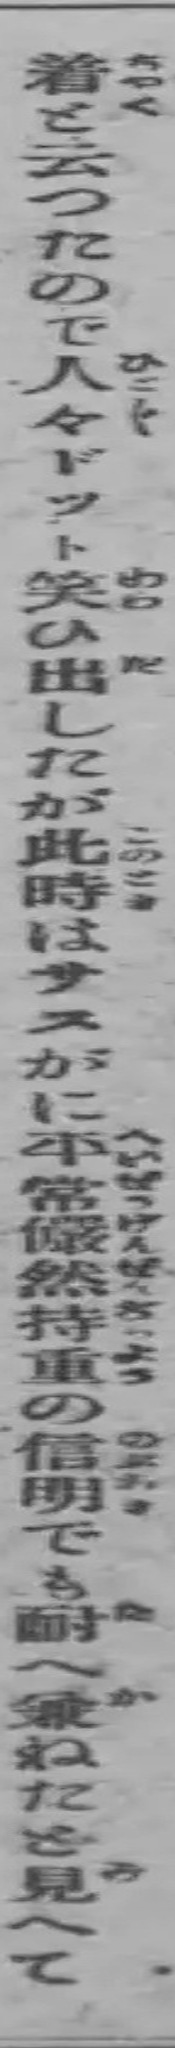着と云つたので人々ドツト笑ひ出したが此時はサスがに平常厳然持重の信明でも耐へ兼ねたと見へて
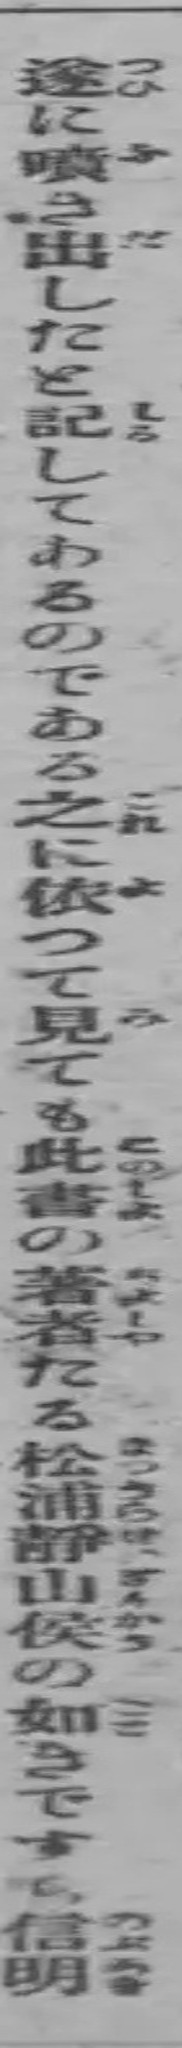遂に噴き出したと記してあるのである之に依つて見ても此書の著者たる松浦静山侯の如きですら信明
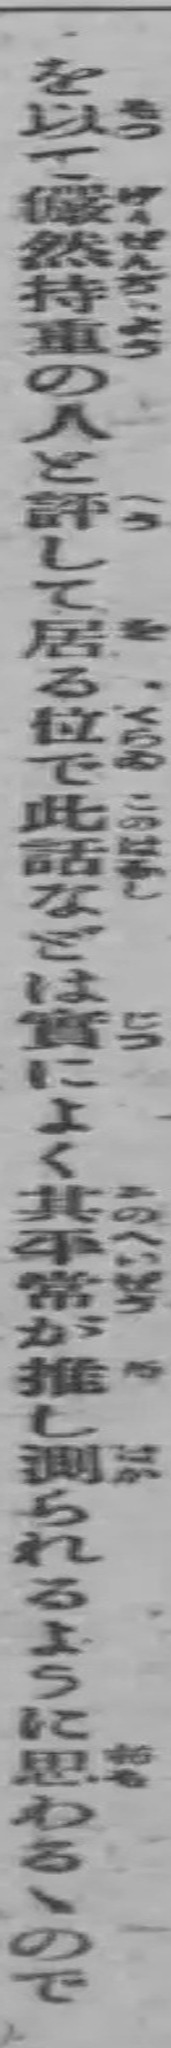を以て厳然持重の人と評して居る位で此話などは実によく其平常が推し測られるように思わるゝので
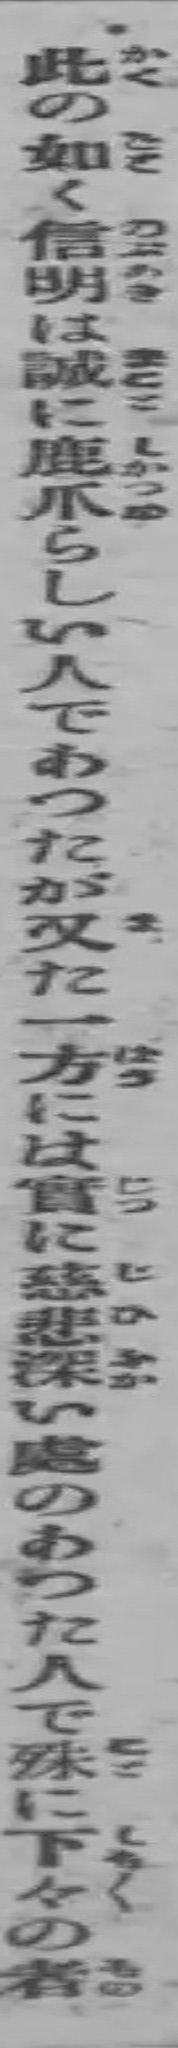信明の仁慈此の如く信明は誠に鹿爪らしい人であつたが又た一方には実に慈悲深い処のあつた人で殊に下々の者
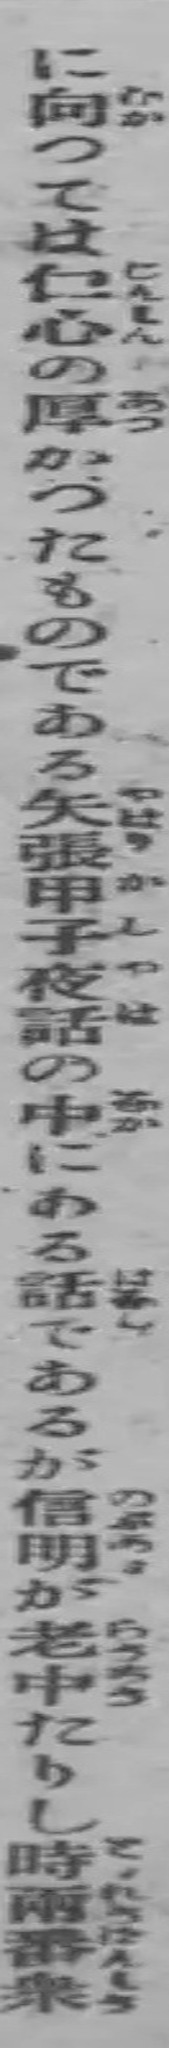に向つては仁心の厚かつたものである矢張甲子夜話の中にある話であるが信明が老中たりし時両番衆
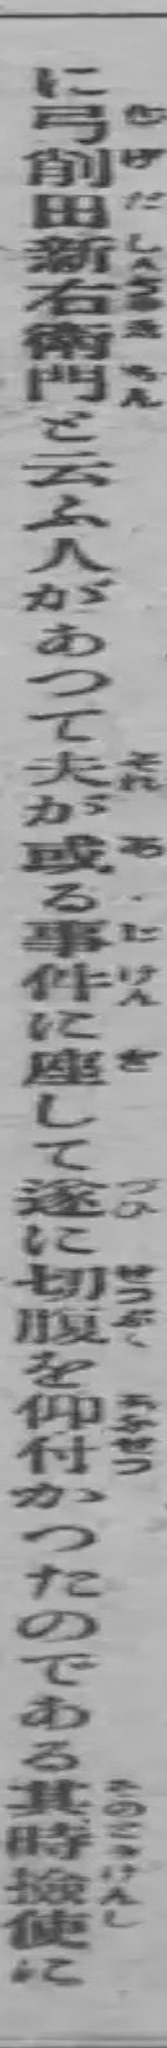に弓削田新右衛門と云ふ人があつて夫が或る事件に座して遂に切腹を仰付かつたのである其時検使に
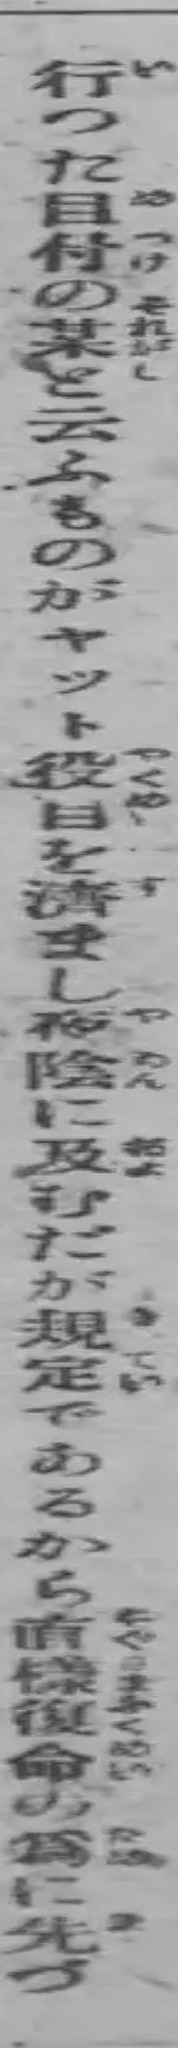行つた目付の某と云ふものがヤツト役目を済まし夜陰に及むだが規定であるから直様復命の為に先づ
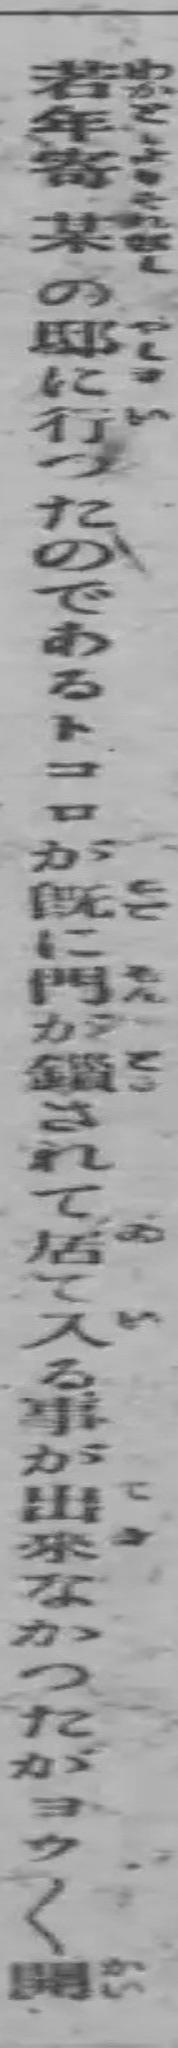若年寄某の邸に行つたのであるトコロが既に門が鎖されて居て入る事がで出来なかつたがヨウ〳〵開
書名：豊橋市史談
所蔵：国立国会図書館 National Diet Library, JAPAN
